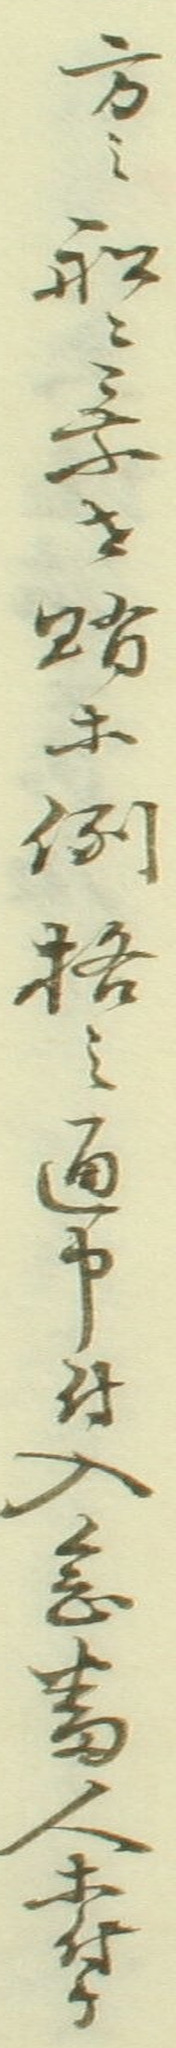方之船に乗せ賄等例格之通申付入念番人等付け
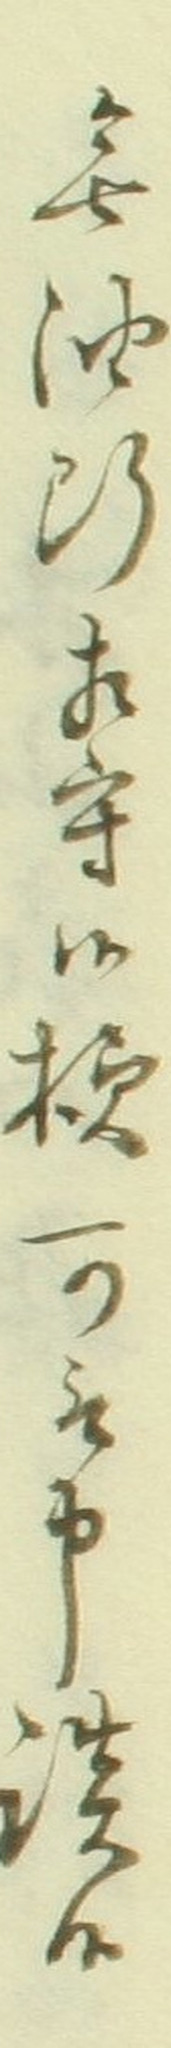無油断相守候様可被申談候
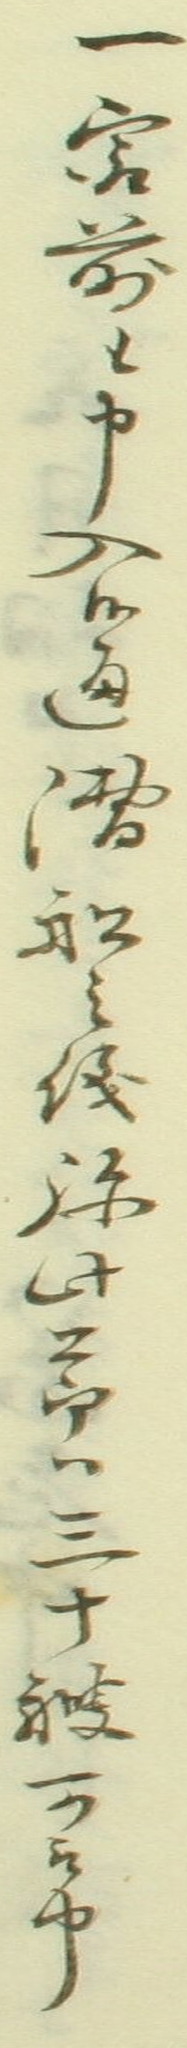一最前も申入候通漕船之儀弥此節は三十艘可被申
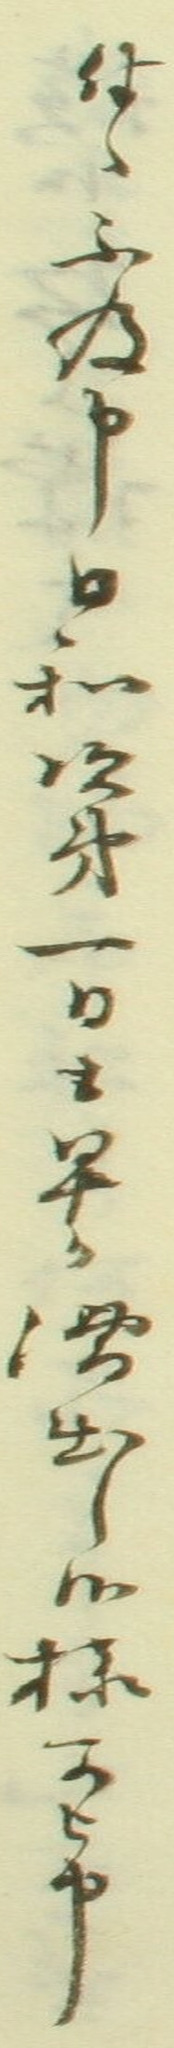付候不及申日和次第一日も早く漕出し候様可被申

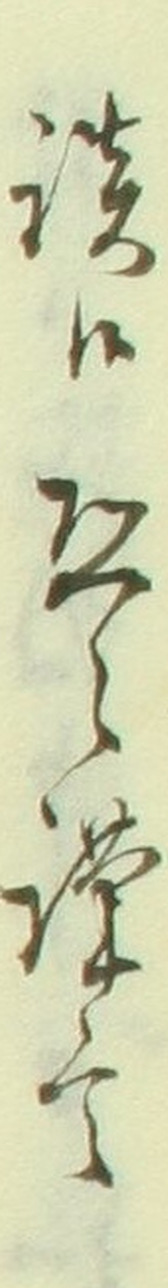談候恐々謹言
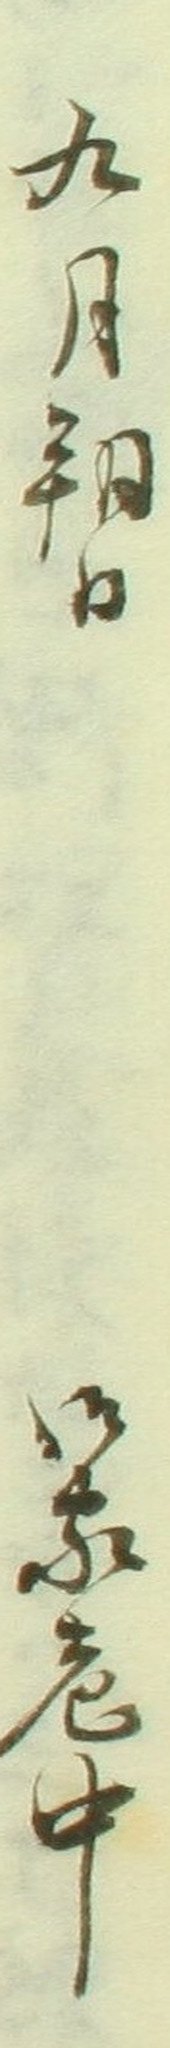九月朔日御家老中
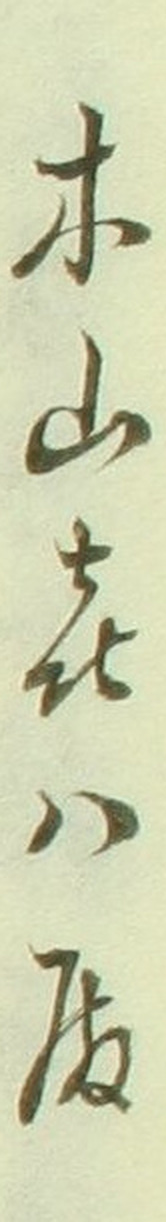木山喜八殿
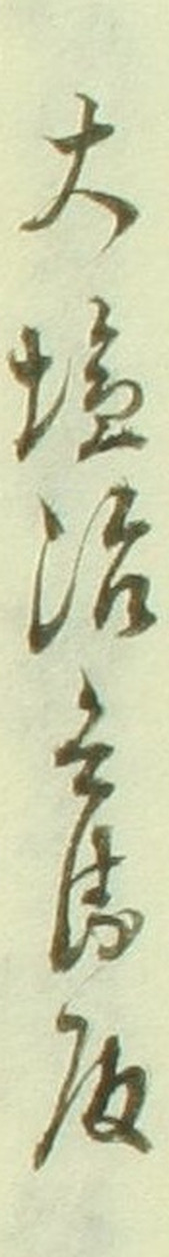大塩治兵衛殿
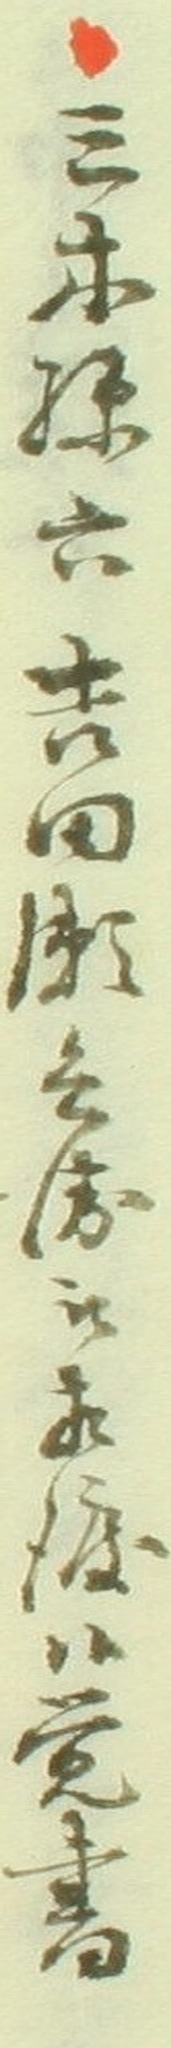三木孫六吉田瀬兵衛被相渡候覚書
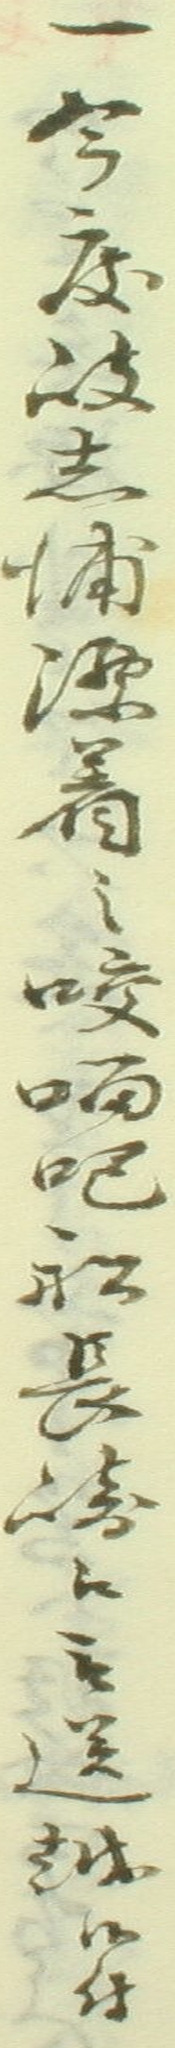一今度岐志浦漂着之咬哺吧船長崎え被送越候付
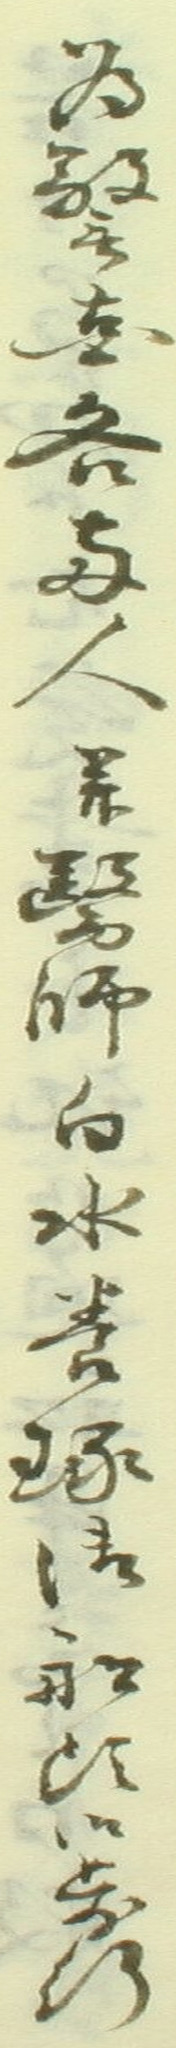為警固各両人并医師白水養琢御船頭御歩行
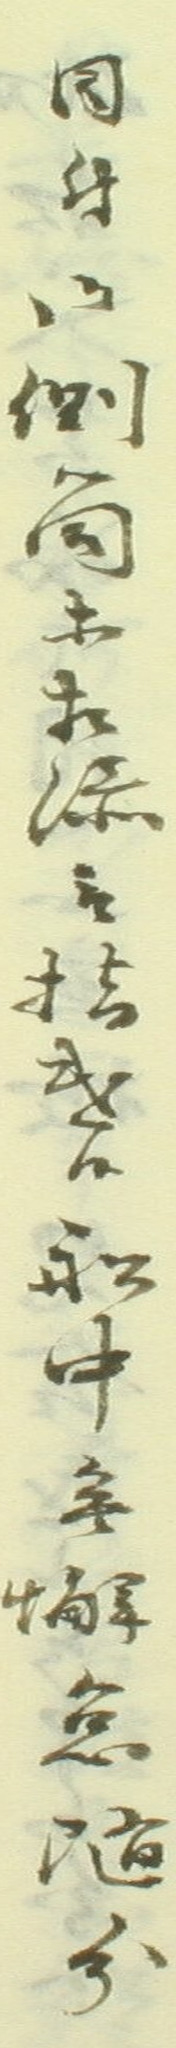目付御側角等相添被指遣候船中無懈怠随分
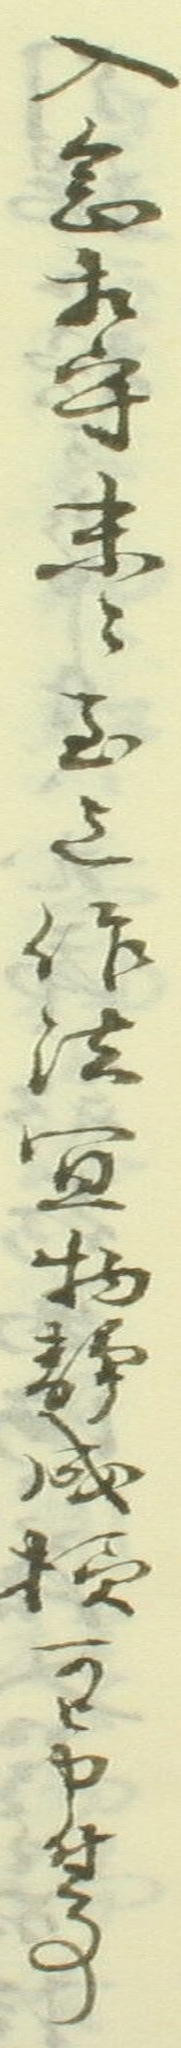入念相守末々至迄作法宜物静成様可被申付事
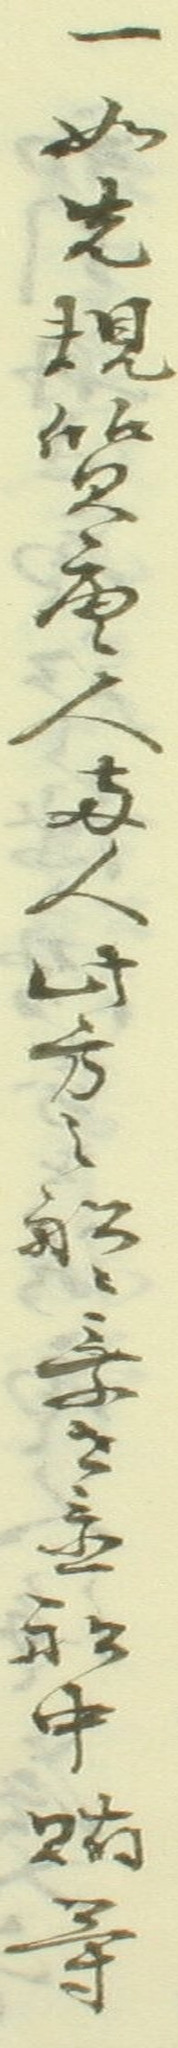一如先規質唐人両人此方之船に乗せ置船中賄等
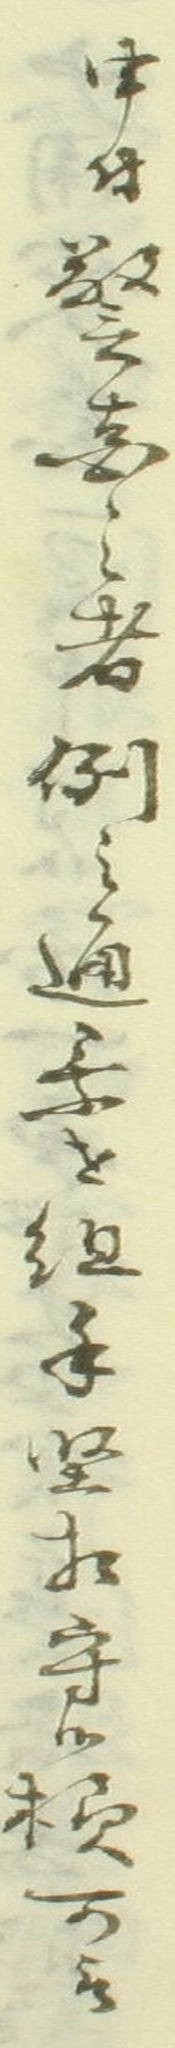申付警固之者例之通乗せ組手堅相守候様可被
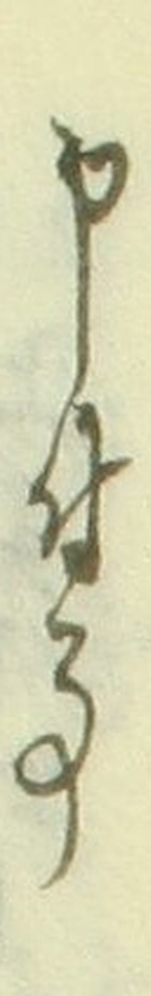申付事
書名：異国船漂着記
